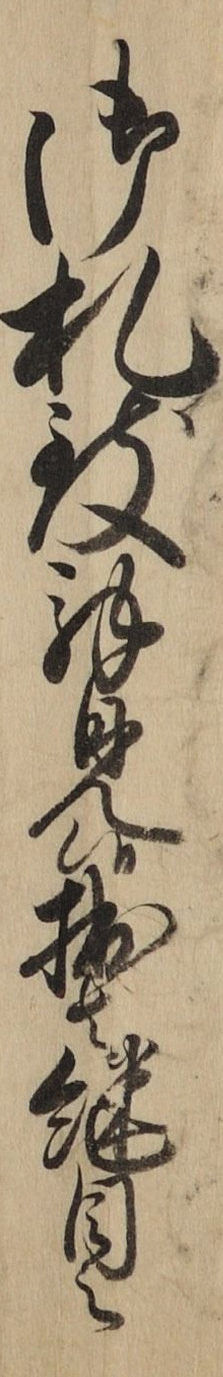御札致拝見候拙者継目之
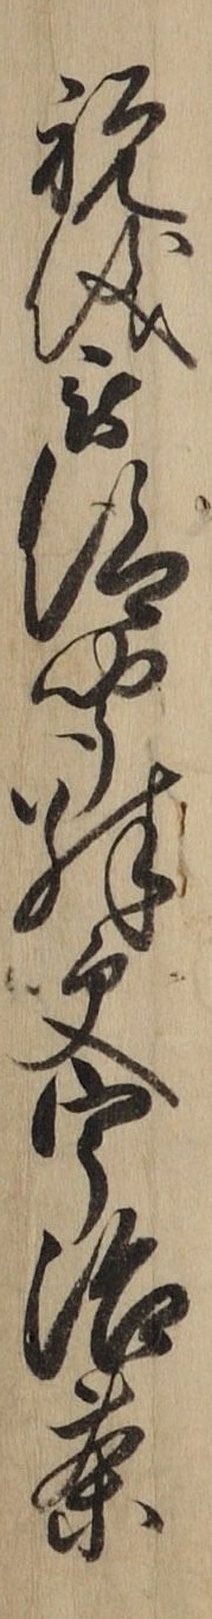祝儀被仰聞殊更宇治茶
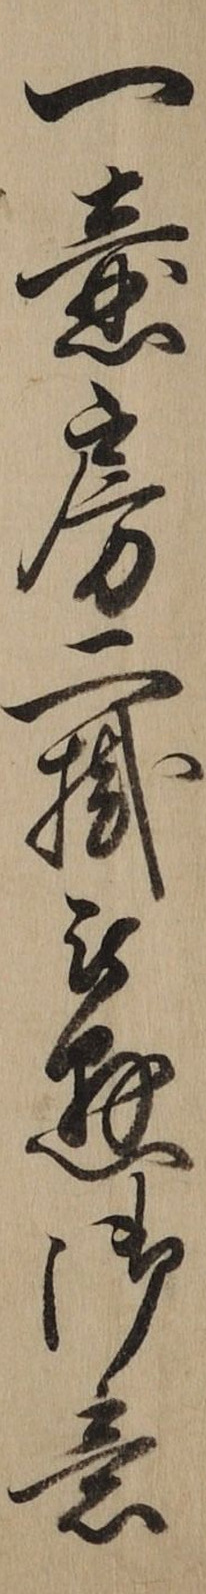一壺房二掛被懸御意
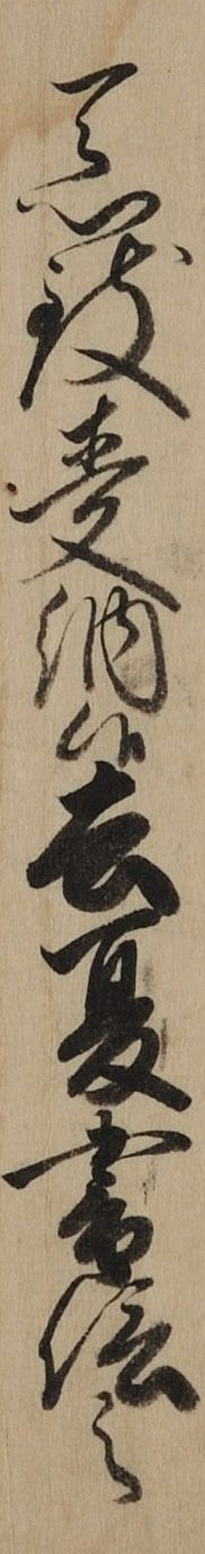忝致受納候去夏書信之
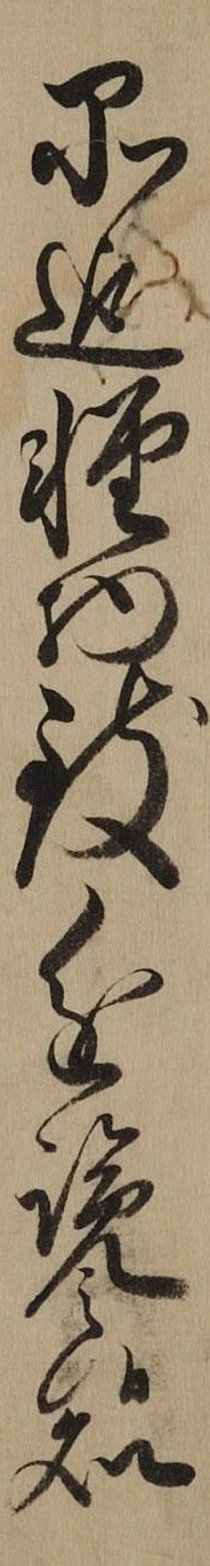品迄軽物致進覧之候処
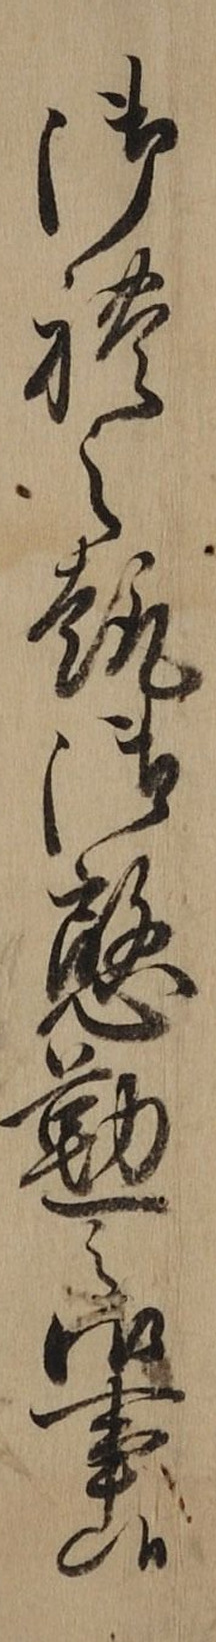御礼之趣慇懃之御事候
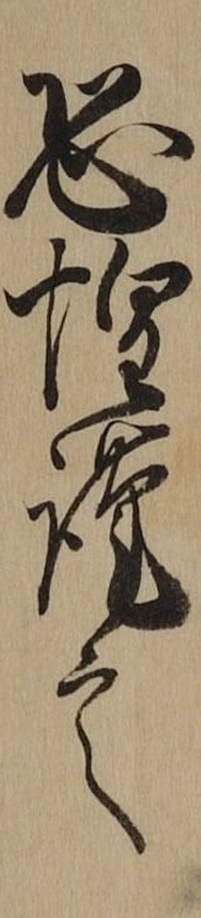恐惶謹言
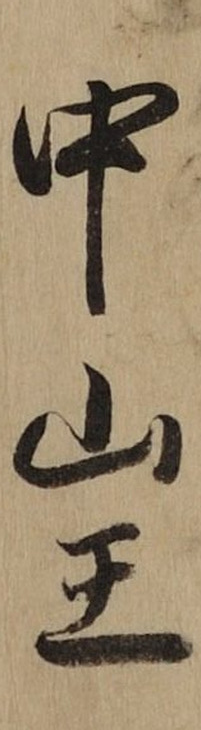中山王
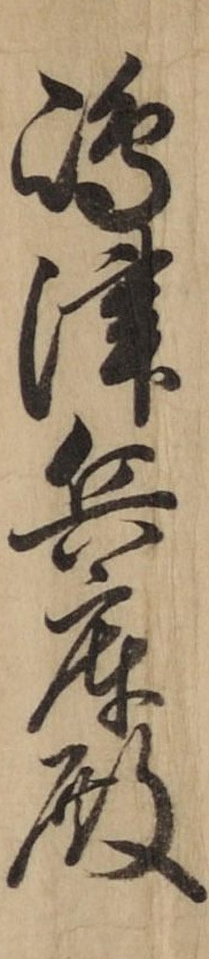嶋津兵庫殿
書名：中山王尚敬花押印状／1枚
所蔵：University of the Ryukyus Library
